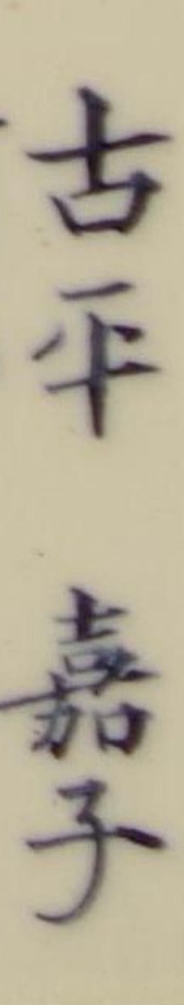古平嘉子
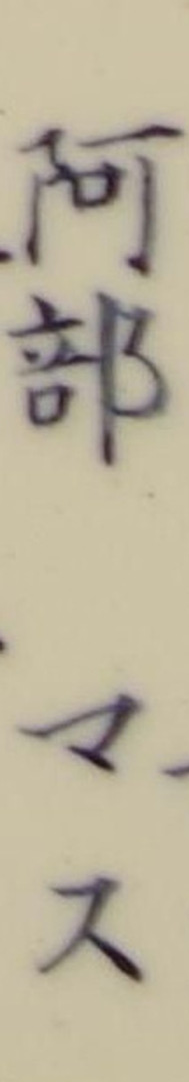阿部マス
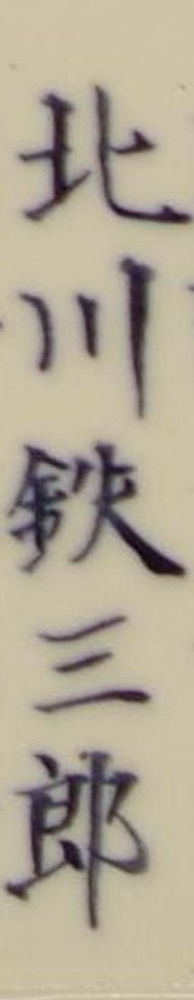北川鉄三郎
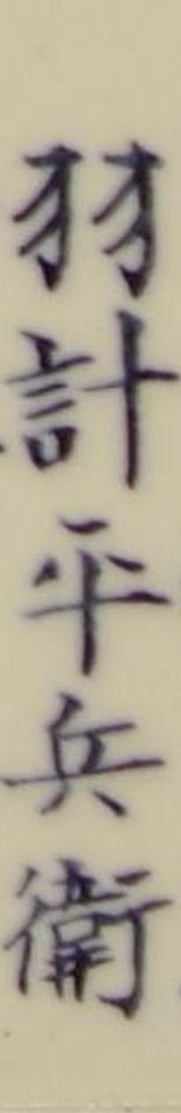羽計平兵衛
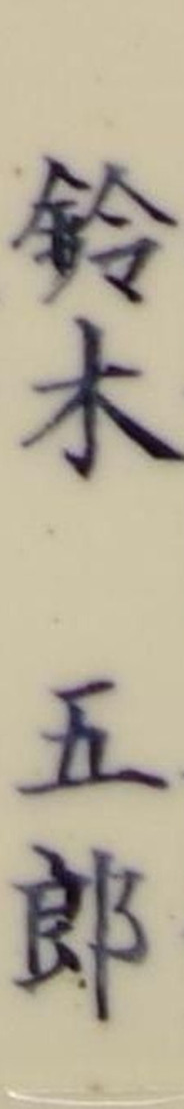鈴木五郎
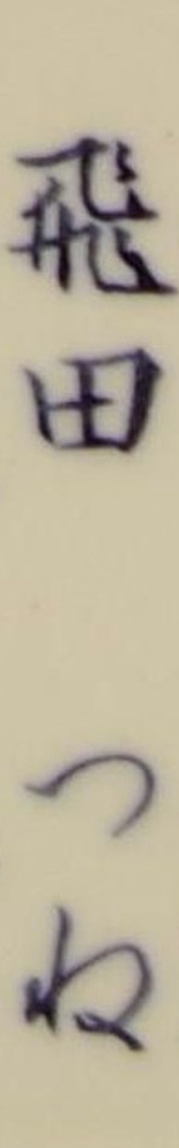飛田つね
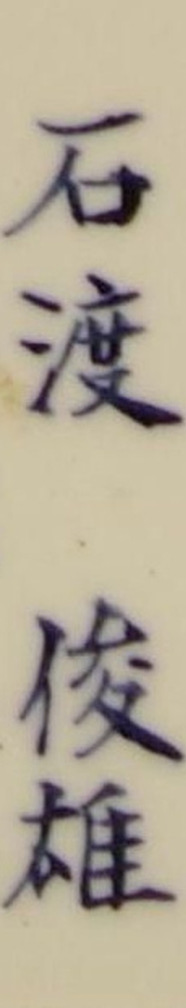石渡俊雄
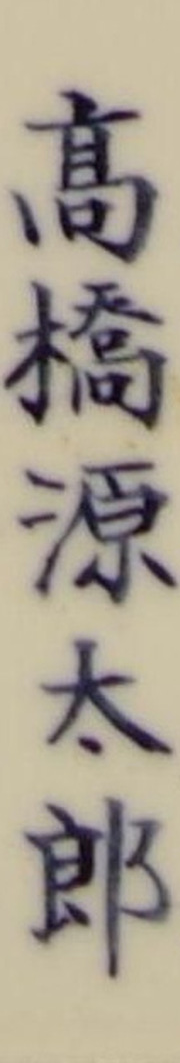高橋源太郎
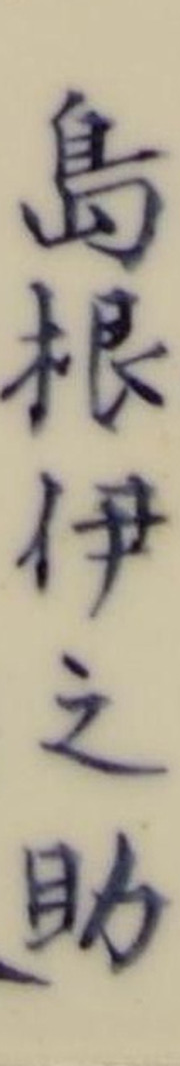島根伊之助
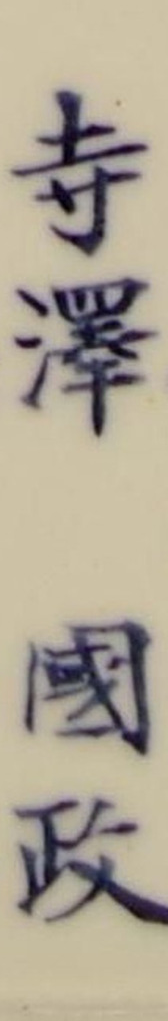寺澤國政
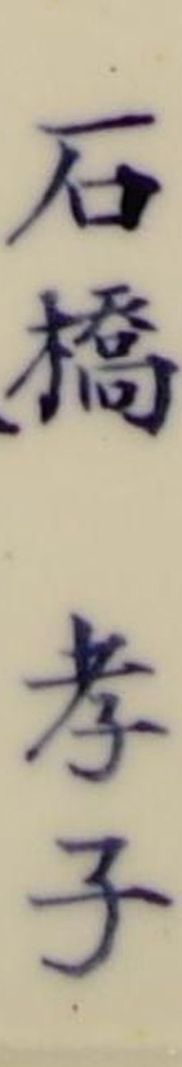石橋孝子
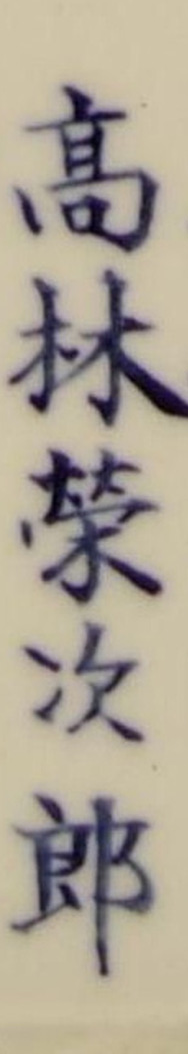高林榮次郎
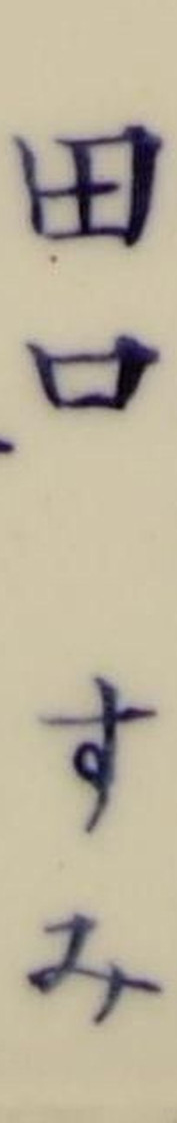田口すみ
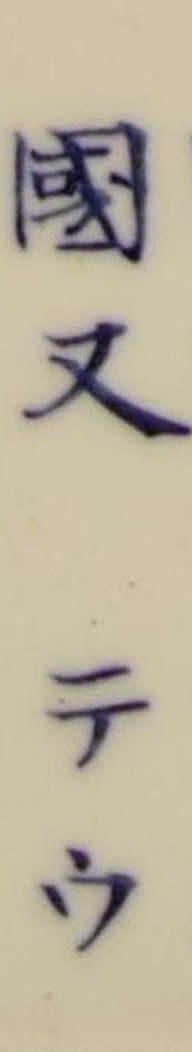國又テウ
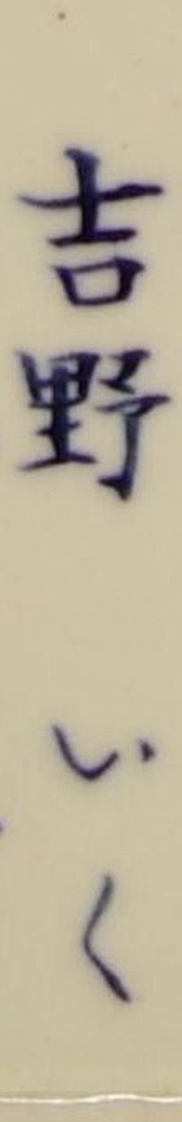吉野いく
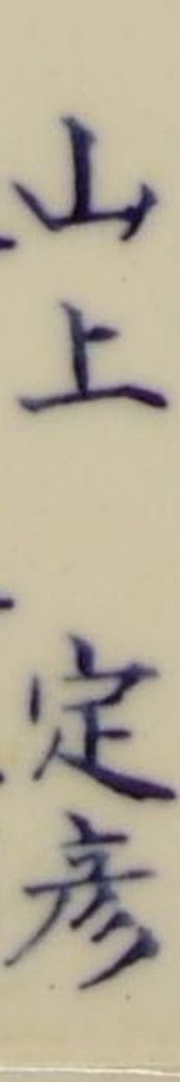山上定彦
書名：E~L
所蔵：高野山金剛峯寺
